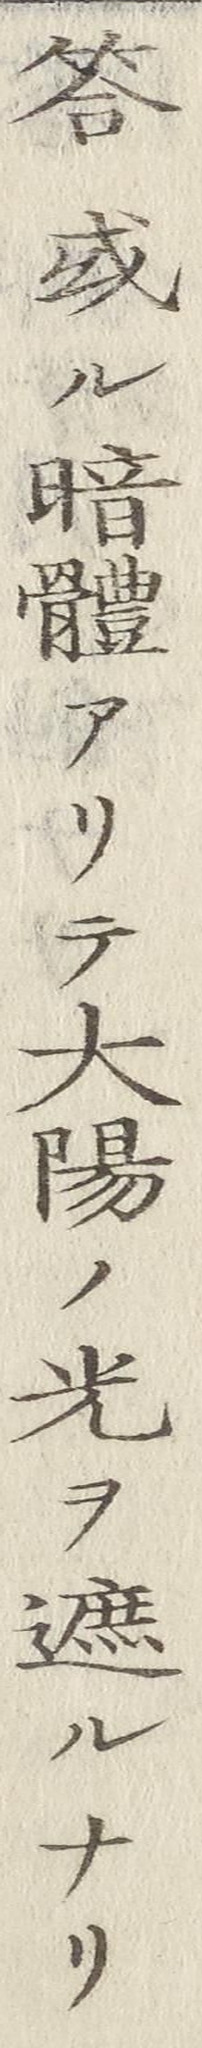答或ル暗体アリテ大陽ノ光ヲ遮ルナリ
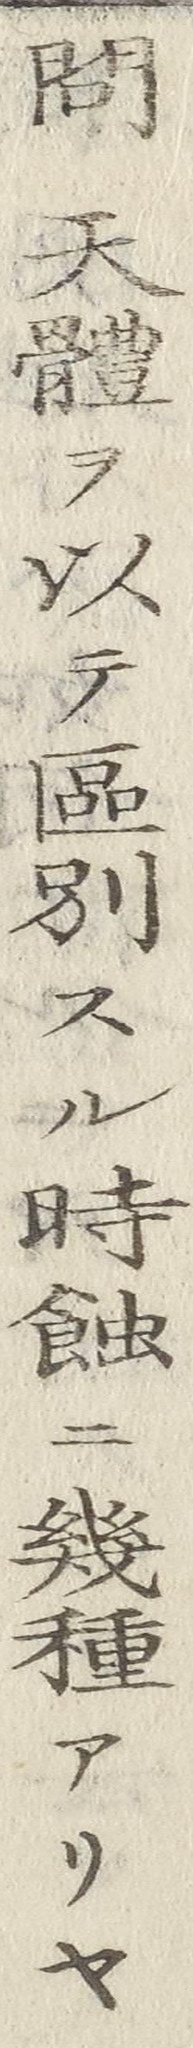問天体ヲ以テ区別スル時蝕ニ幾種アリヤ
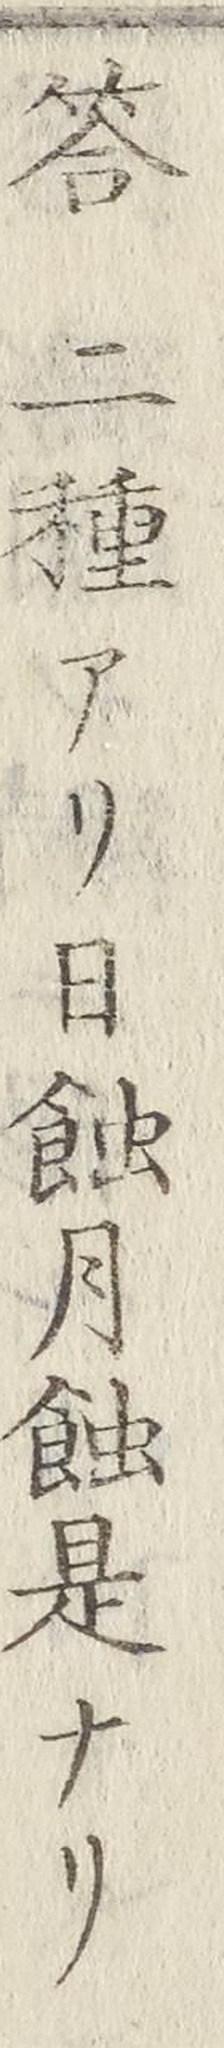答二種アリ日蝕月蝕是ナリ
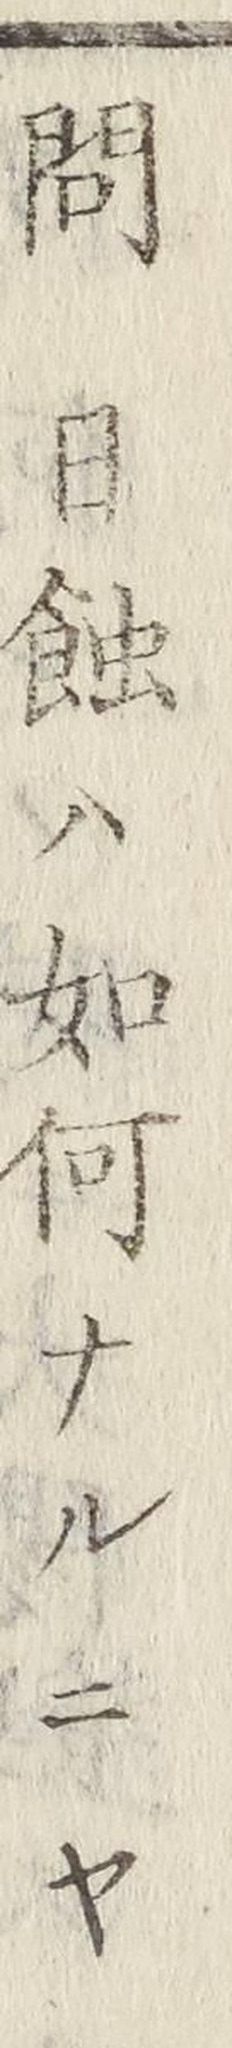問日蝕ハ如何ナルニヤ
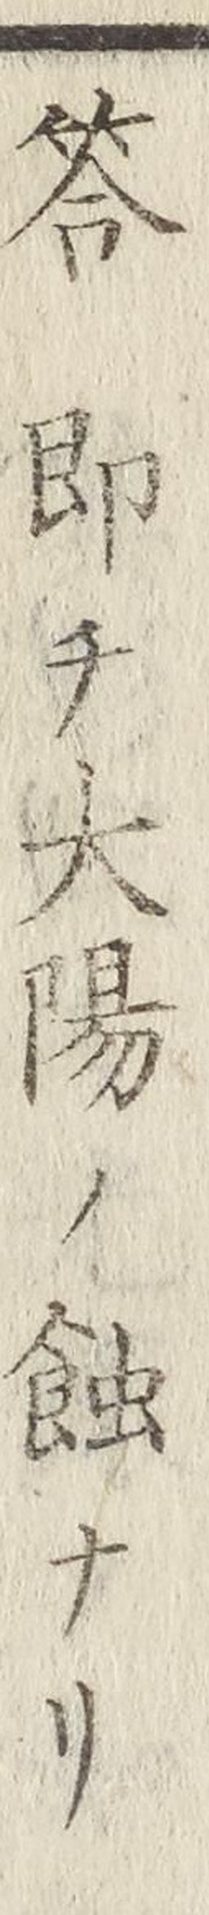答即チ大陽ノ蝕ナリ
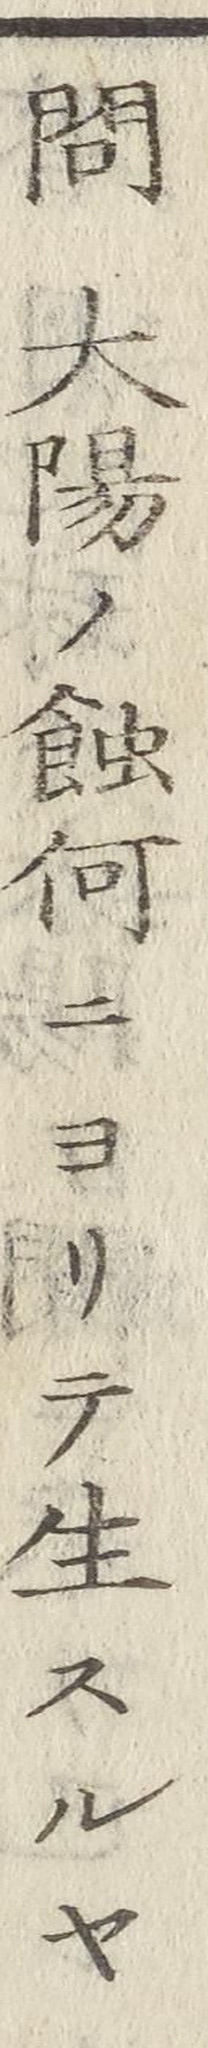問大陽ノ蝕何ニヨリテ生スルヤ

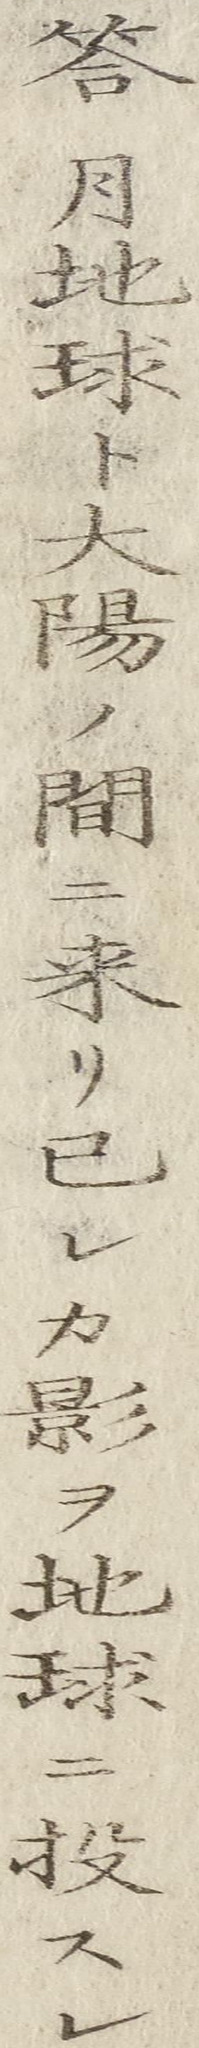答月地球ト大陽ノ間ニ来リ己レカ陰ヲ地球ニ投スレ
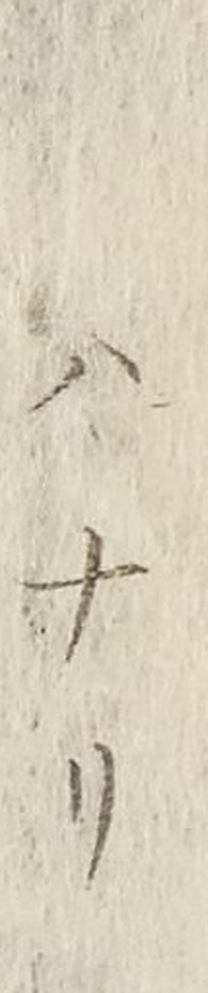ハナリ
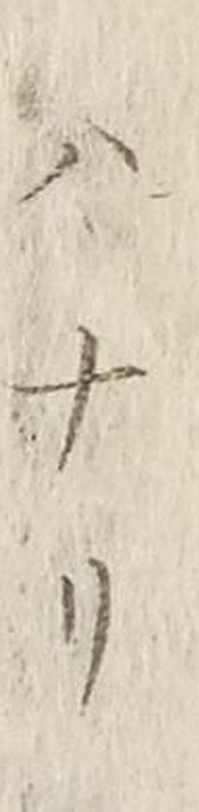ハナリ
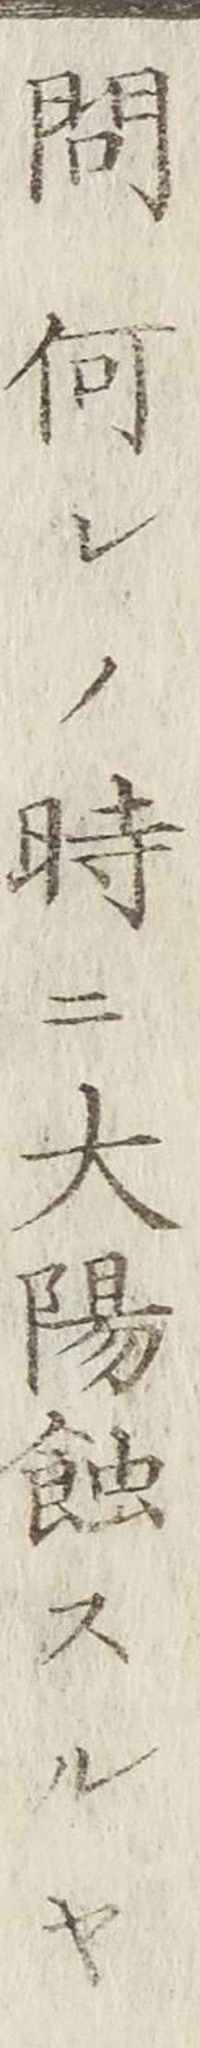問何レノ時ニ大陽蝕スルヤ
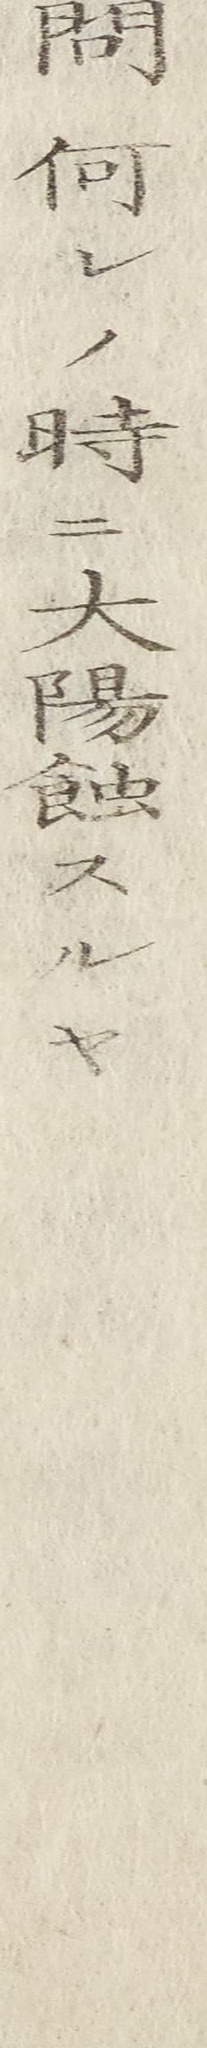問何レノ時ニ大陽蝕スルヤ
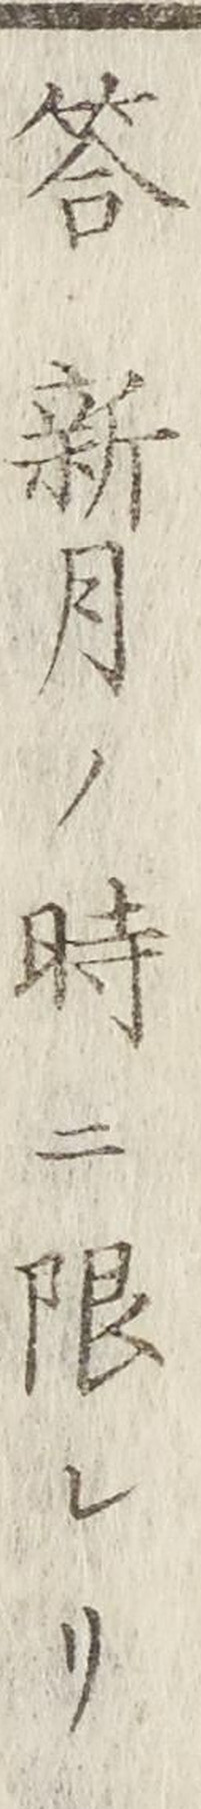答新月ノ時ニ限レリ
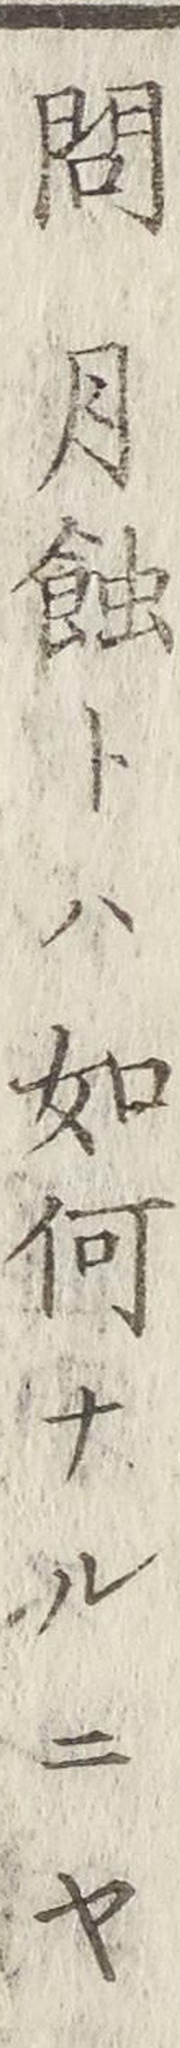問月蝕トハ如何ナルニヤ
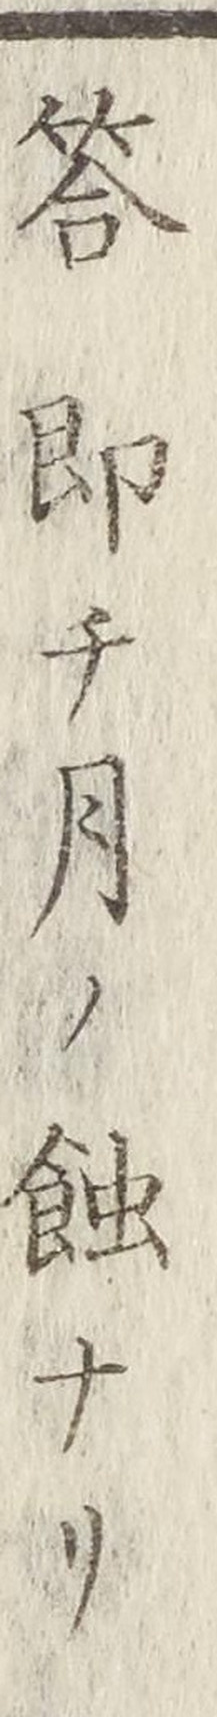答即チ月ノ蝕ナリ
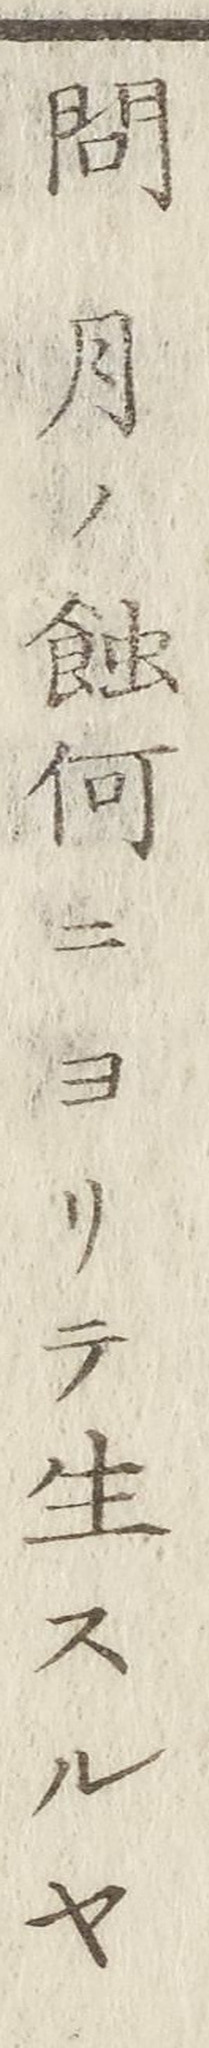問月ノ蝕何ニヨリテ生スルヤ
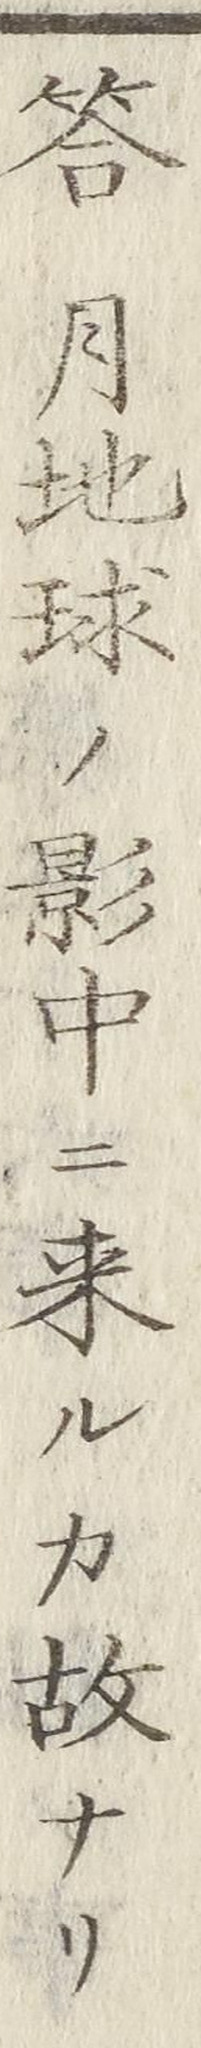答月地球ノ影中ニ来ルカ故ナリ
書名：星学圖説　下
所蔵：東京大学地震研究所図書室 Earthquake Research Institute Library, The University of Tokyo, JAPAN
